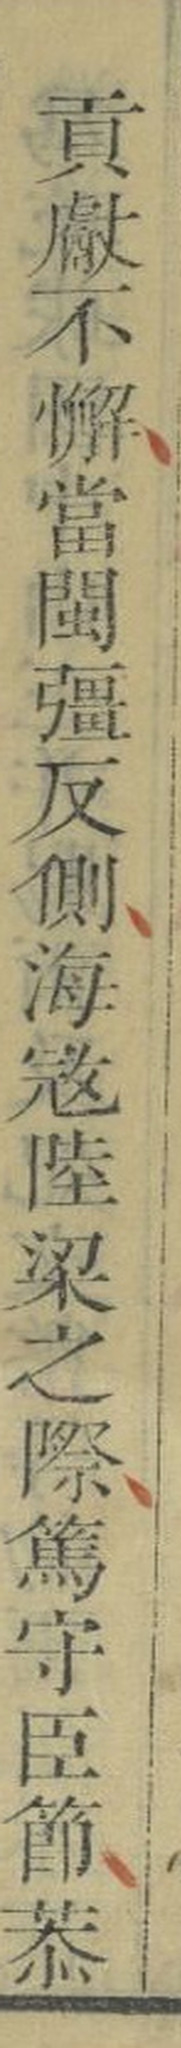貢献不懈当閩彊反側海寇陸梁之際篤守臣節恭
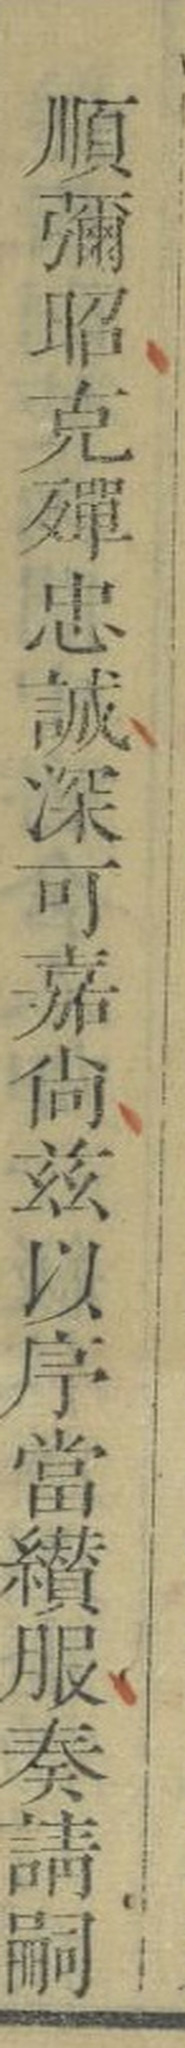順弥昭克殫忠誠深可嘉尚茲以序当纘服奏請嗣
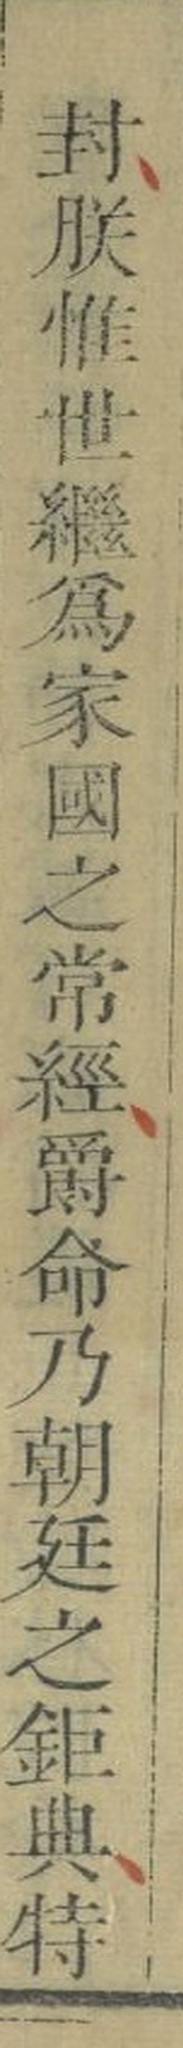封朕惟世継為家国之常経爵命乃朝廷之鉅典特
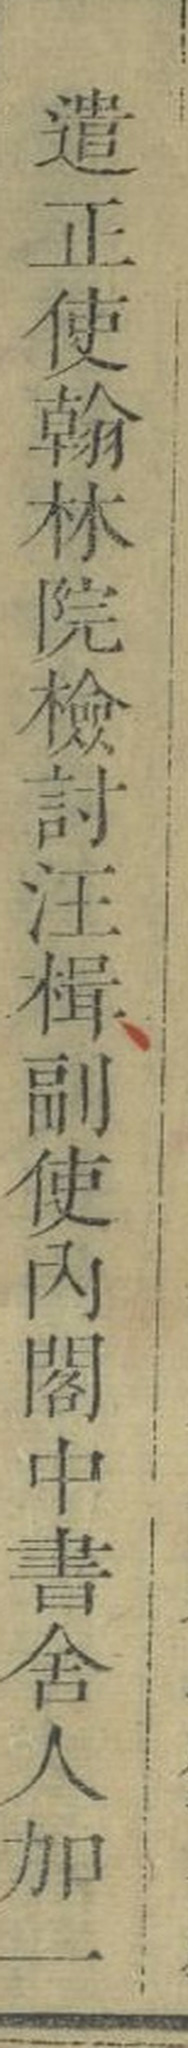遣正使翰林院検討汪楫副使内閣中書舎人加一
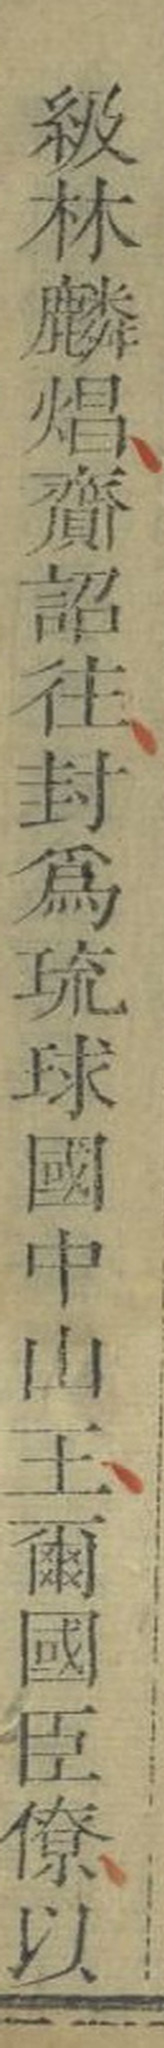級林麟焻齎詔往封為琉球国中山王爾国臣僚以
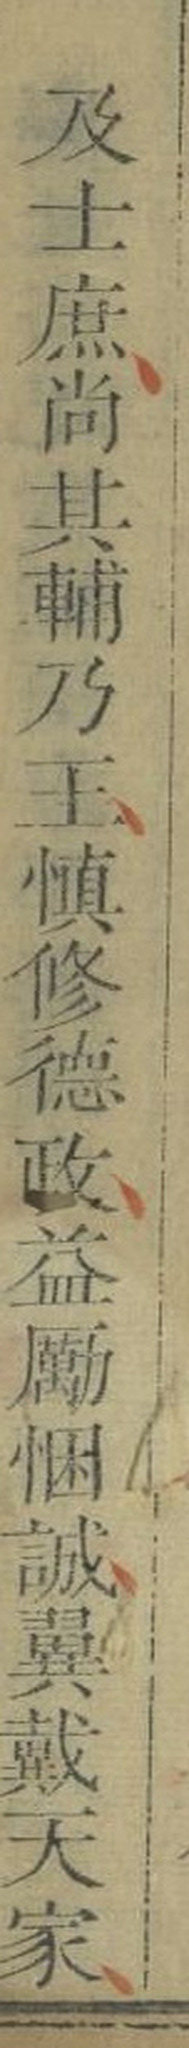及士庶尚其輔乃王慎修徳政益励悃誠翼戴天家

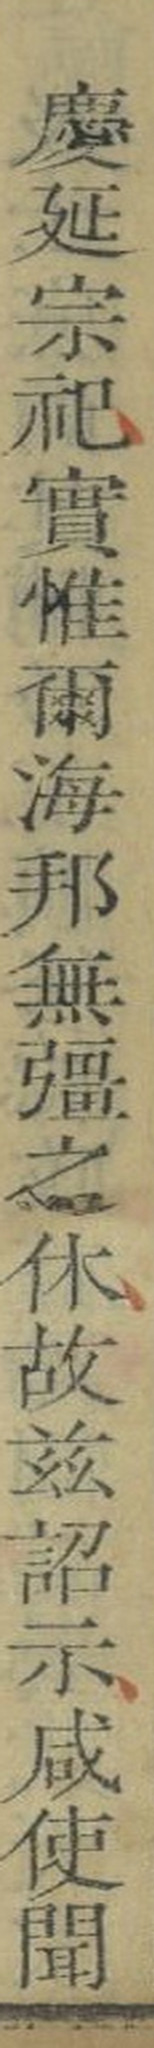慶延宗祀実惟爾海邦無彊之休故茲詔示咸使聞
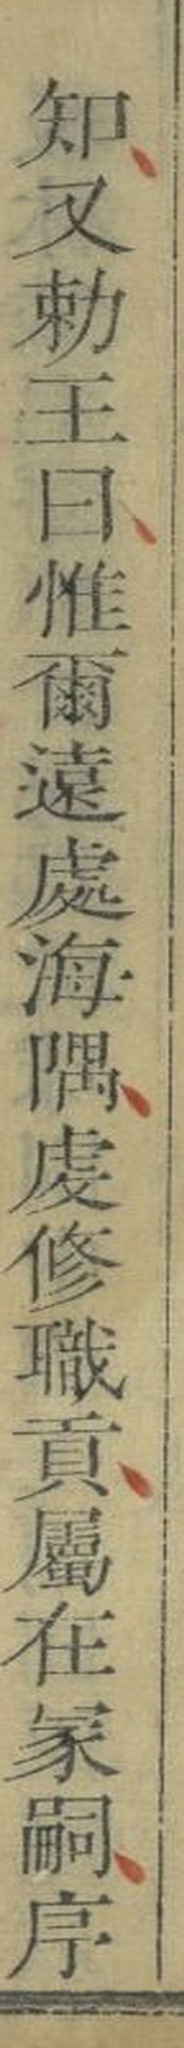知又勅王曰惟爾遠処海隅虔修職貢属在冡嗣序
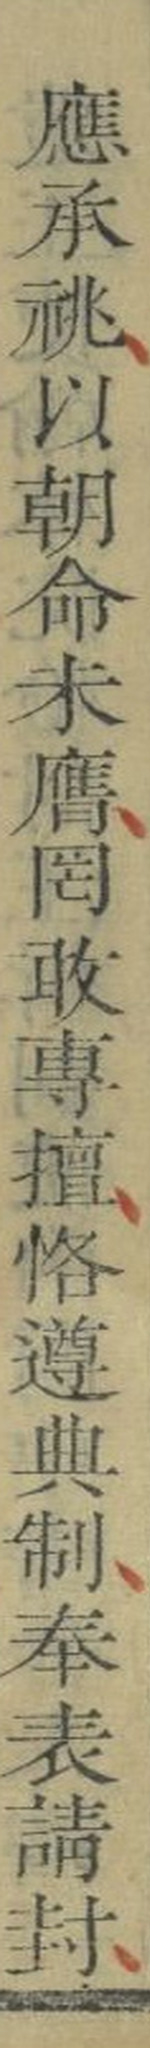応承祧以朝命未膺罔敢専擅恪遵典制奉表請封
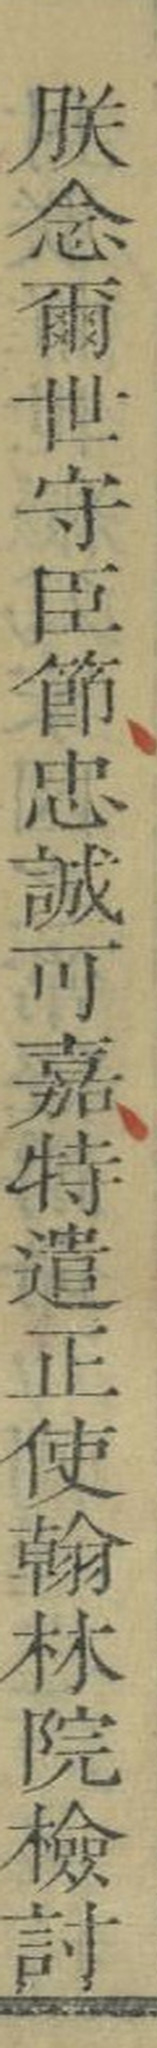朕念爾世守臣節忠誠可嘉特遣正使翰林院検討
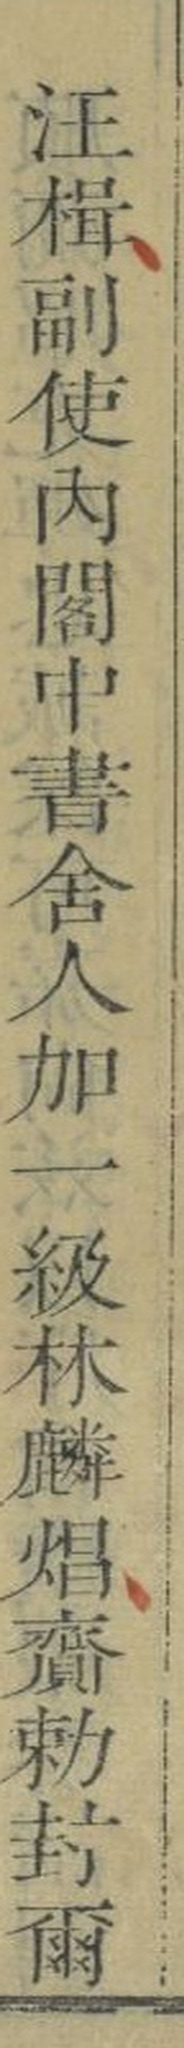汪楫副使内閣中書舎人加一級林麟焻齎勅封爾
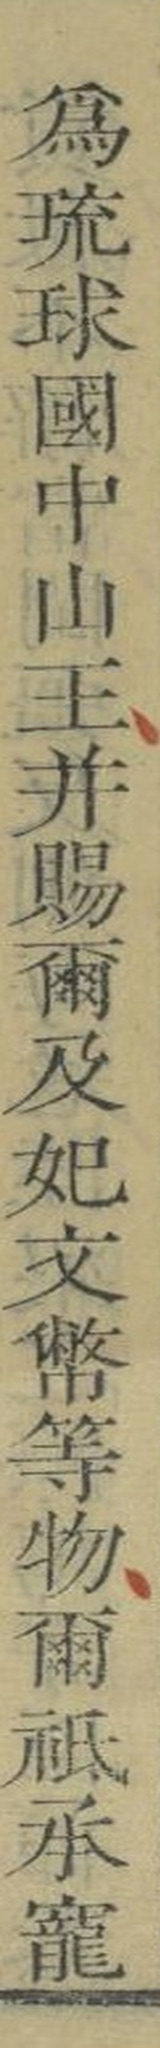為琉球国中山王并賜爾及妃文幣等物爾祇承寵
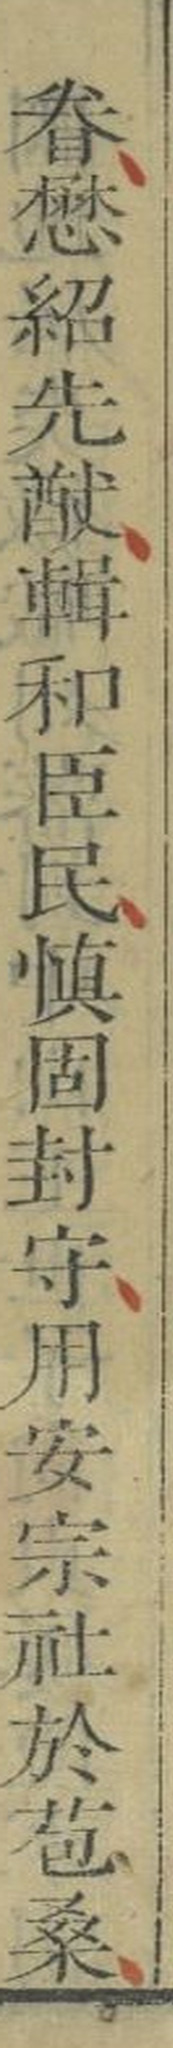眷懋紹先猷輯和臣民慎固封守用安宗社於苞桑
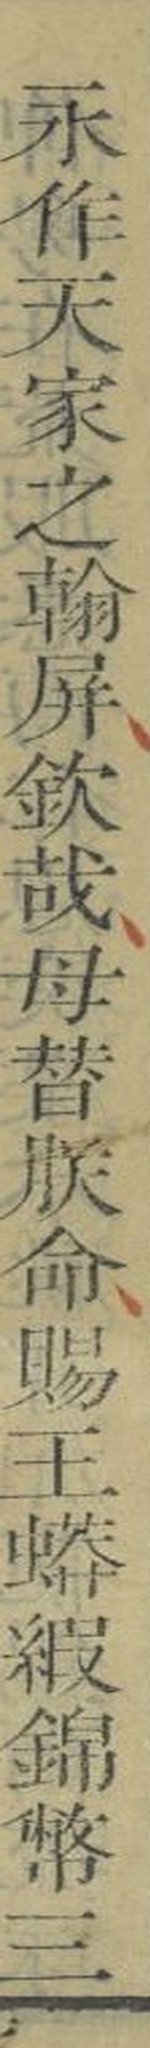永作天家之翰屏欽哉母替朕命賜王蟒緞錦幣三
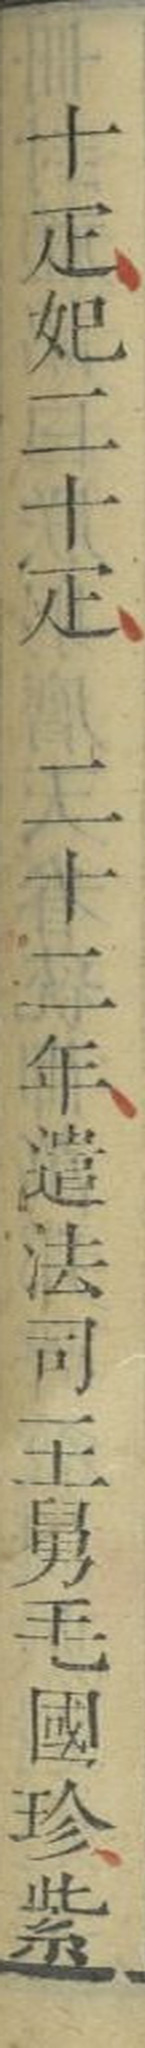十疋妃二十疋二十二年遣法司王舅毛国珍紫
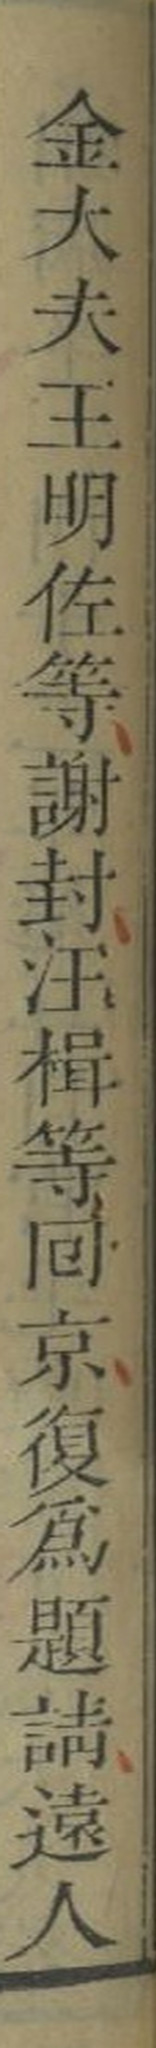金大夫王明佐等謝封汪楫等回京復為題請遠人
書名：中山伝信録 巻三
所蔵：University of the Ryukyus Library
